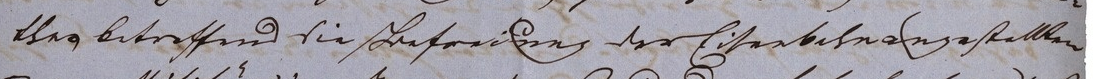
thes betreffend die Befreiung der Eisenbahnangestellten
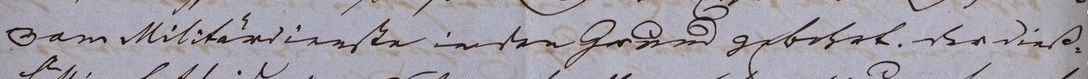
vom Militärdienste in den Grund gebohrt. Der dieß-
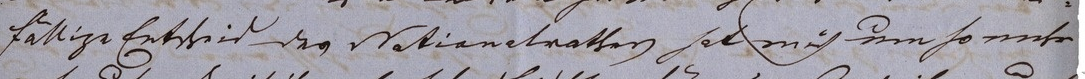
fällige Entscheid des Nationalrathes hat mich um so mehr
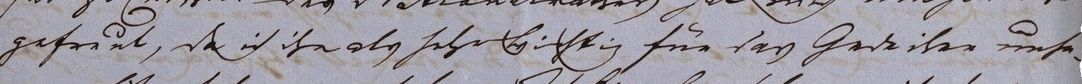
gefreut, da ich ihn als sehr wichtig für das Gedeihen unse-
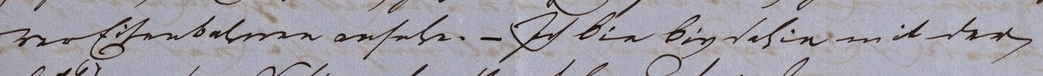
rer Eisenbahnen ansehe. – Ich bin bis dahin mit der
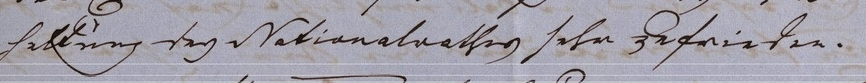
Haltung des Nationalrathes sehr zufrieden.
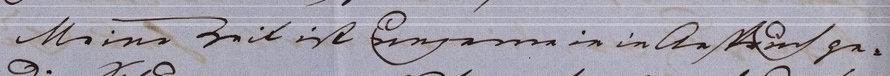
Meine Zeit ist ungemein in Anspruch ge-
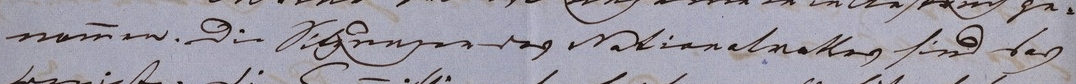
nommen. Die Sitzungen des Nationalrathes sind das
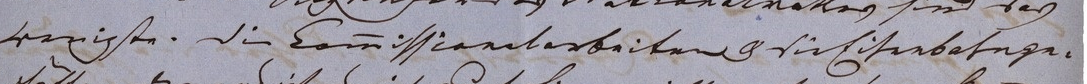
wenigste. Die Commissionalarbeiten & die Eisenbahnge-
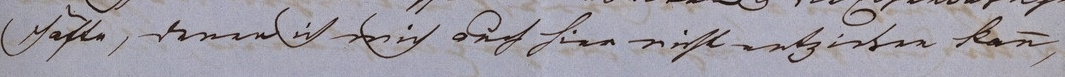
schäfte, denen ich mich auch hier nicht entziehen kann,
